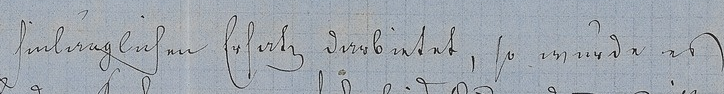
hinlänglichen Ersatz darbietet, so würde es
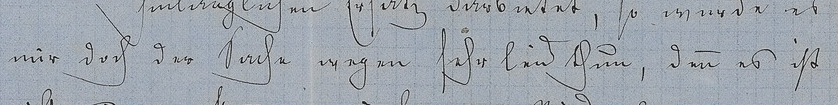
mir doch der Sache wegen sehr leid thun, denn es ist
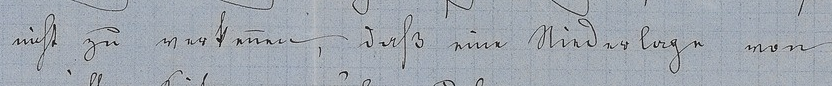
nicht zu verkennen, daß eine Niederlage von
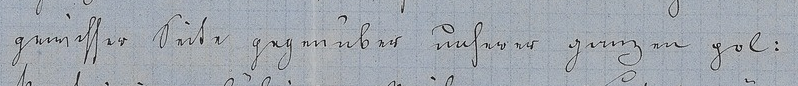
gewisser Seite gegenüber unserer ganzen pol:
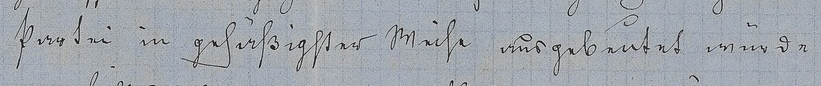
Partei in gehäßigster Weise ausgebeutet würde
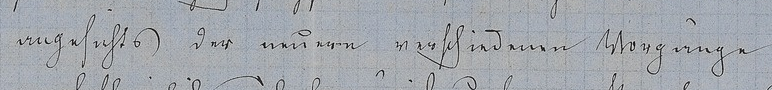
angesichts der neuern verschiedenen Vorgänge
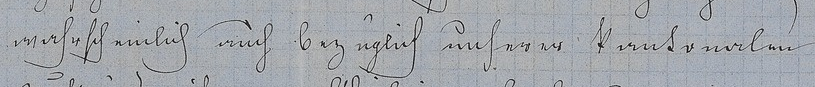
wahrscheinlich auch bezüglich unserer kantonalen
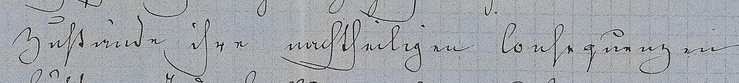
Zustände ihre nachtheiligen Consequenzen
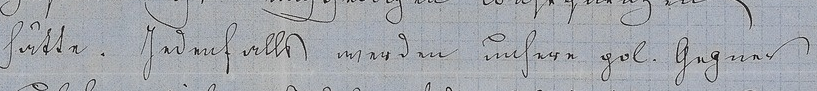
hätte. Jedenfalls werden unsere pol. Gegner
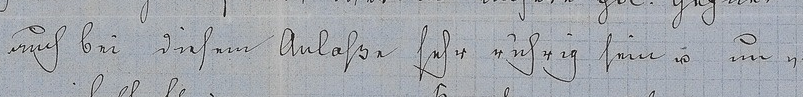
auch bei diesem Anlaße sehr rührig sein & un-
